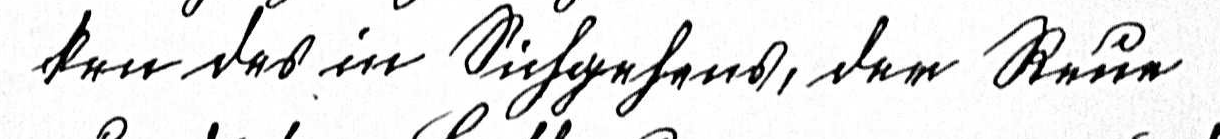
ken des in Sichgehens, der Reue
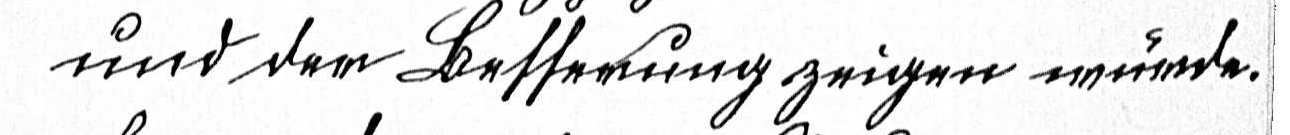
und der Besserung zeigen würde.
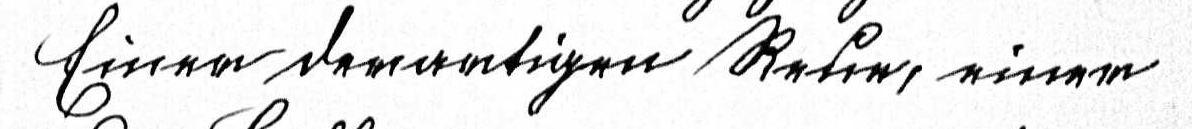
Einer derartigen Reue, einer
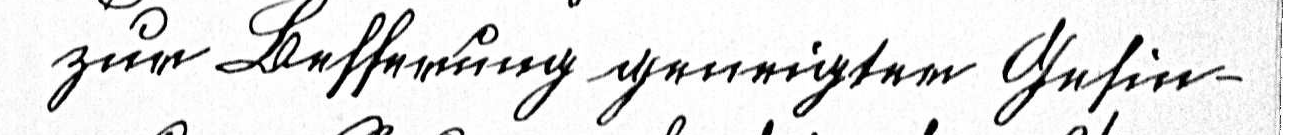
zur Besserung geneigter Gesin¬
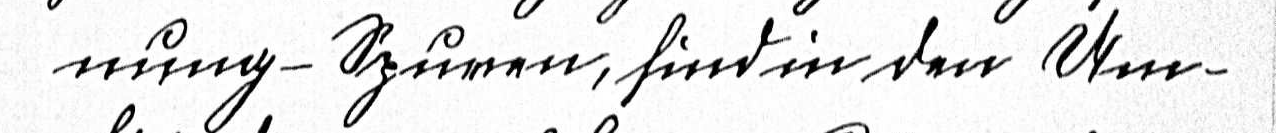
nung-Spuren, sind in den Um¬
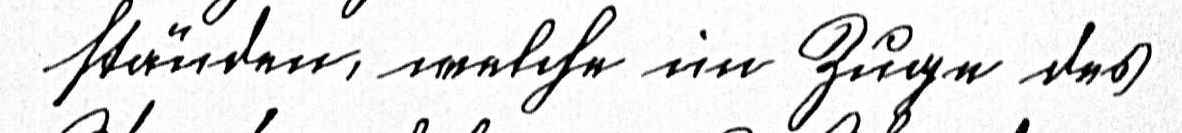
ständen, welche im Zuge des
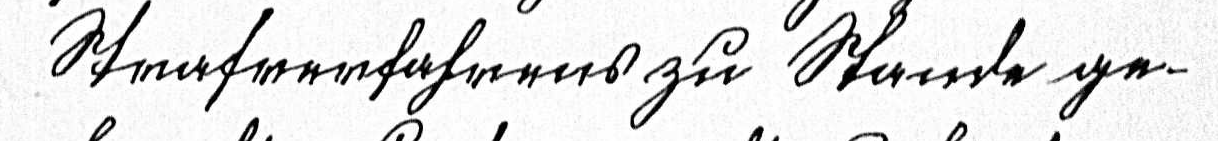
Strafverfahrens zu Stande ge¬
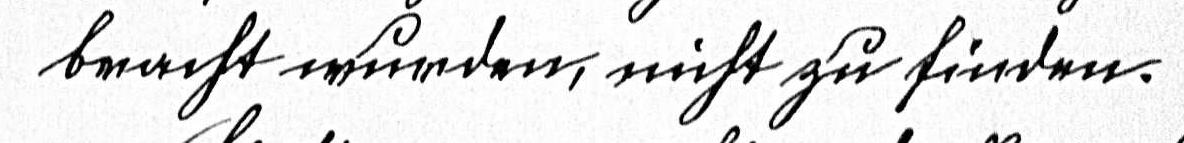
bracht wurden, nicht zu finden.
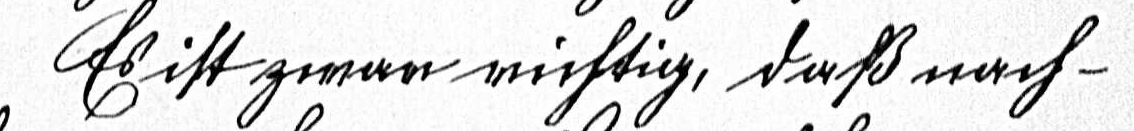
Es ist zwar richtig, daß nach¬
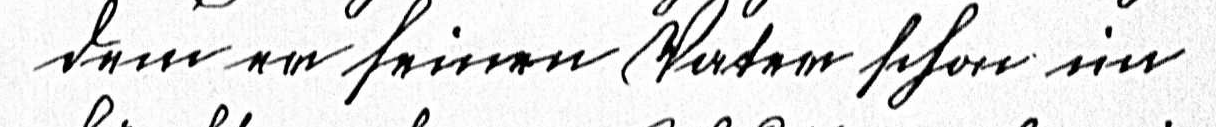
dem er seinen Vater schon im
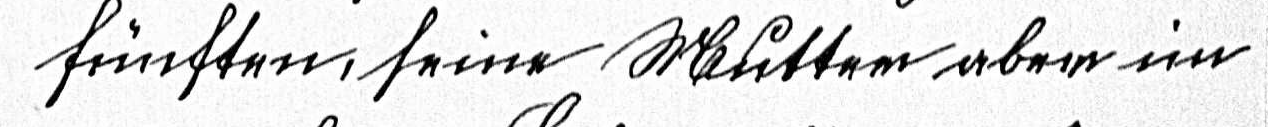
fünften, seine Mutter aber im
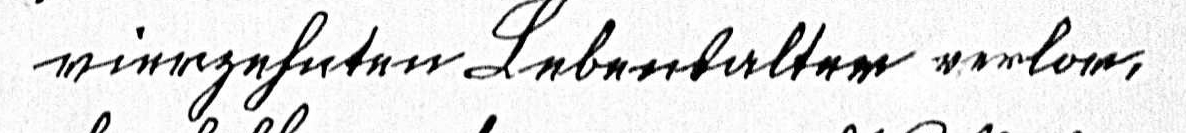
vierzehnten Lebensalter verlor,
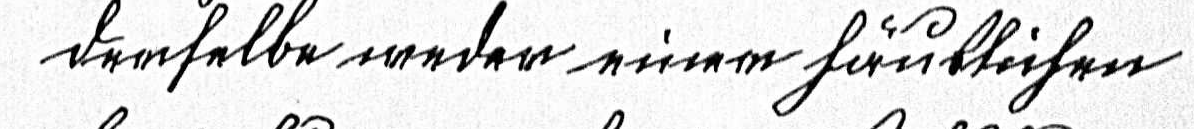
derselbe weder einer häuslichen
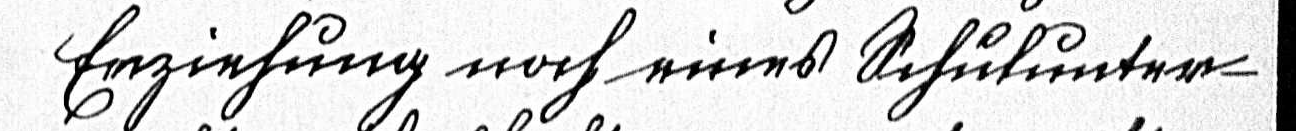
Erziehung noch eines Schulunter¬
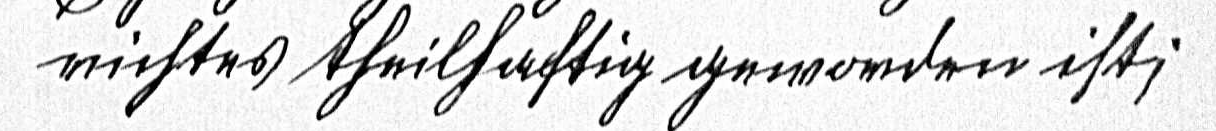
richtes theilhaftig geworden ist;
